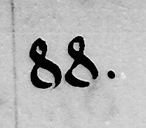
20.
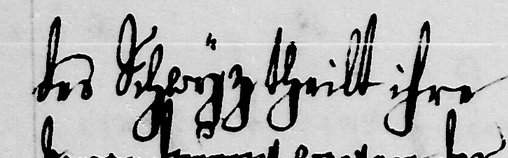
der hierseitigen
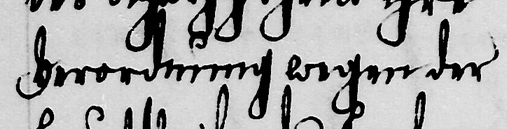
Verordnung wegen Wer¬
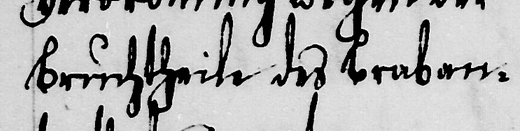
Bruchtheile des Braban¬
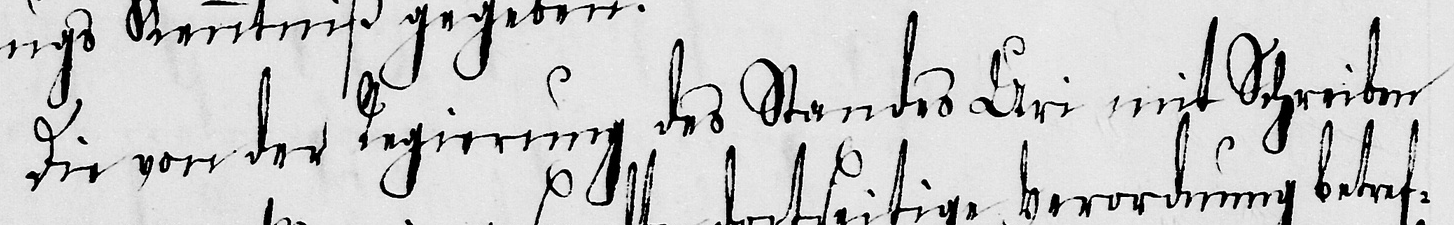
Die von der Regierung des Standes Uri mit Schreiben
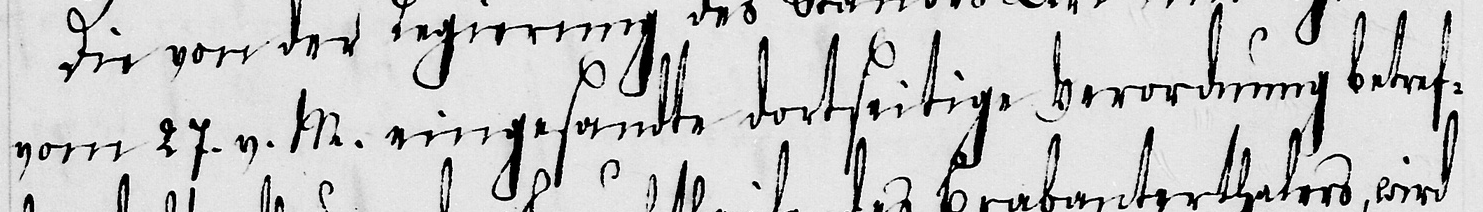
vom 27. v. M. eingesandte dortseitige Verordnung betref¬
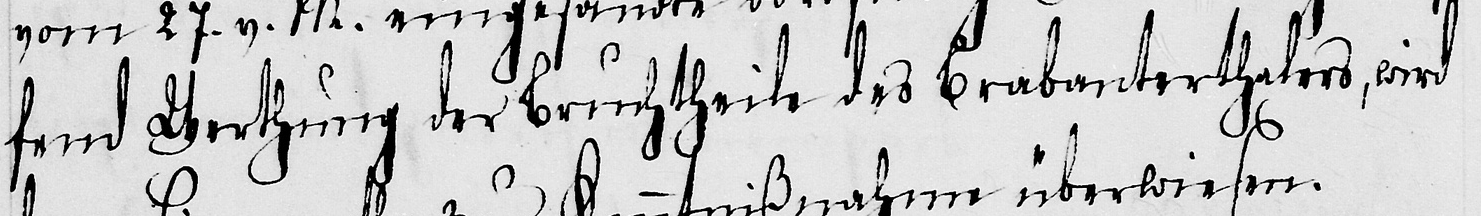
fend Werthung der Bruchtheile des Brabanterthalers, wird
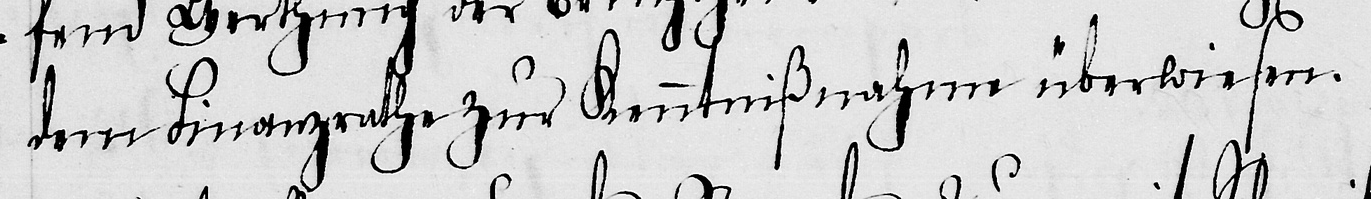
dem Finanzrathe zur Kenntnißnahme überwiesen.
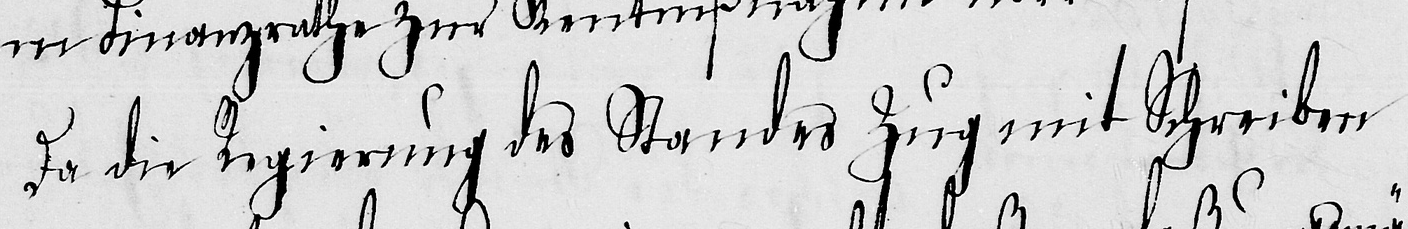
Da die Regierung des Standes Zug mit Schreiben
